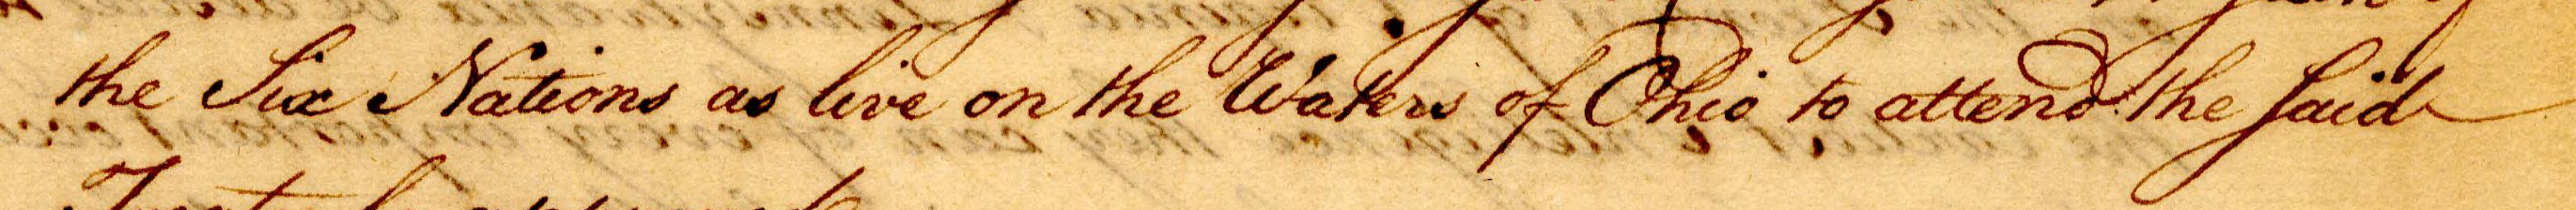the Six Nations as live on the Waters of Ohio to attend the said
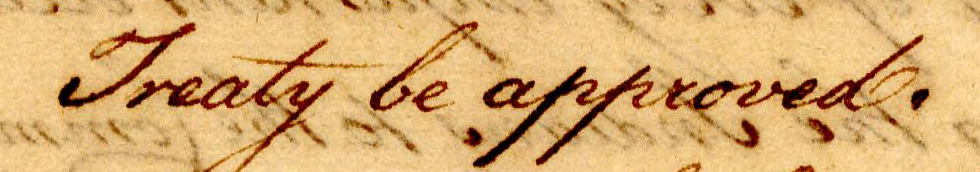Treaty be approved.
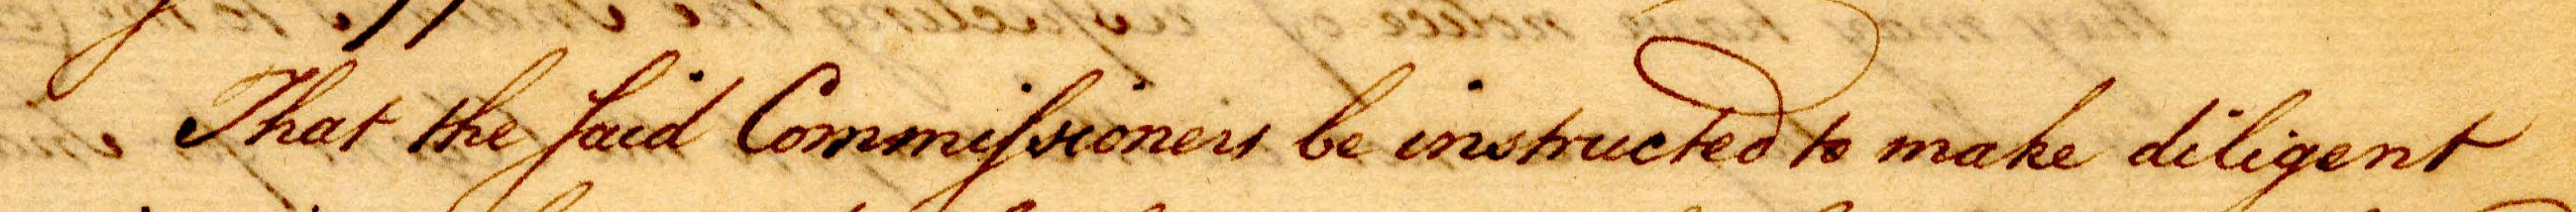That the said Commissioners be instructed to make diligent
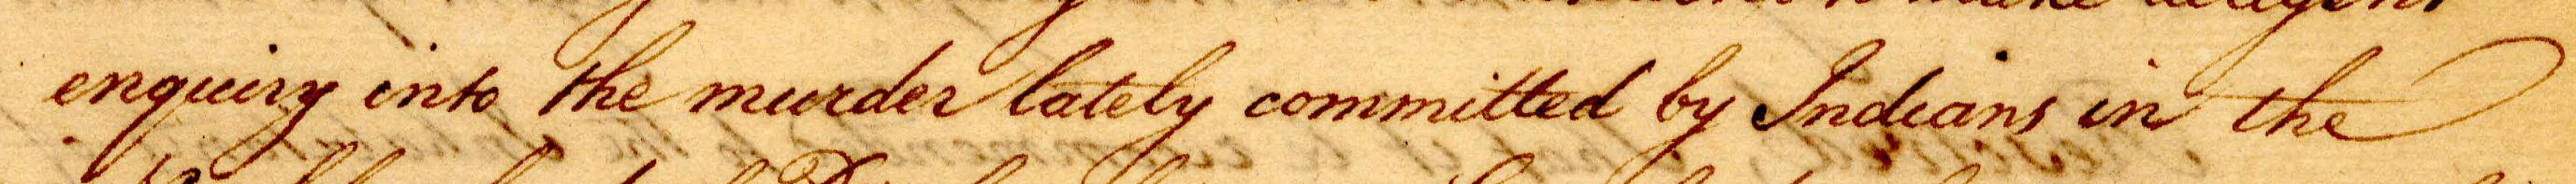enquiry into the murder lately committed by Indians in the
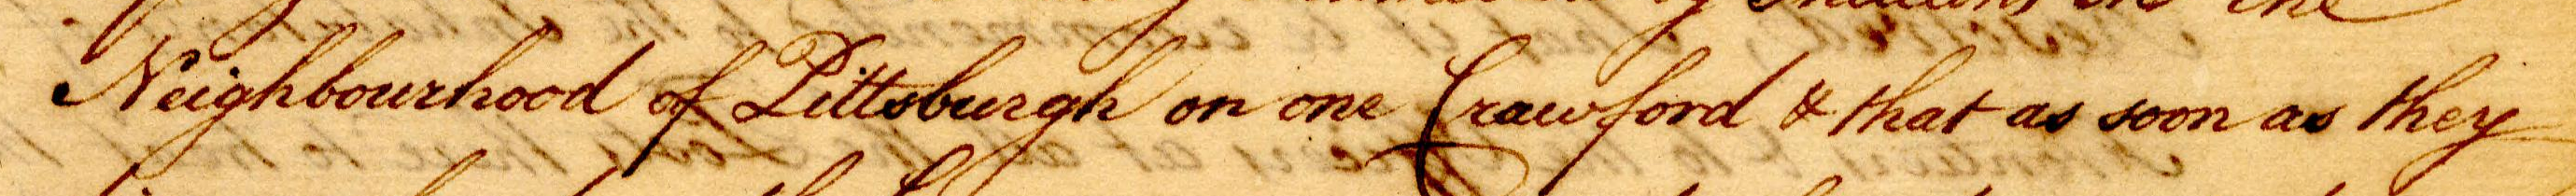Neighbourhood of Pittsburgh on one Crawford & that as soon as they
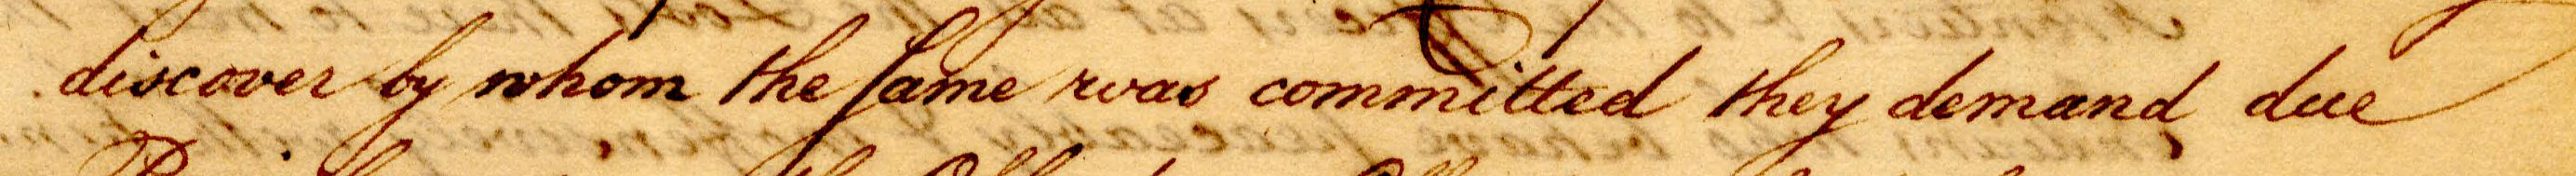discover by whom the same was committed they demand due
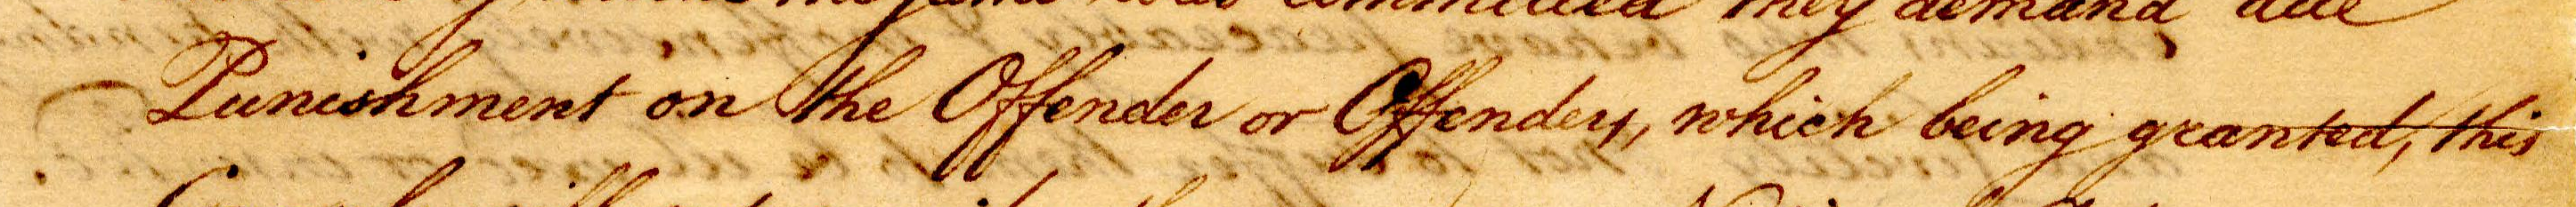Punishment on the Offender or Offenders, which being granted, this
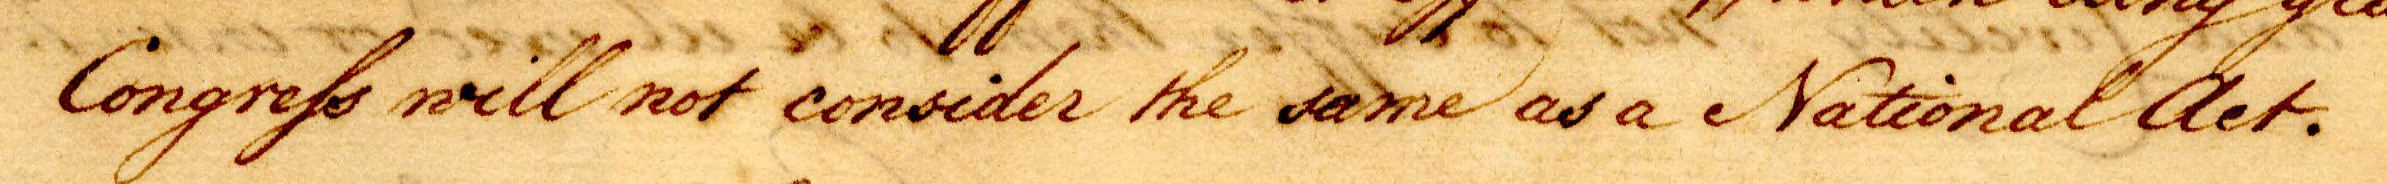Congress will not consider the same as a National Act.
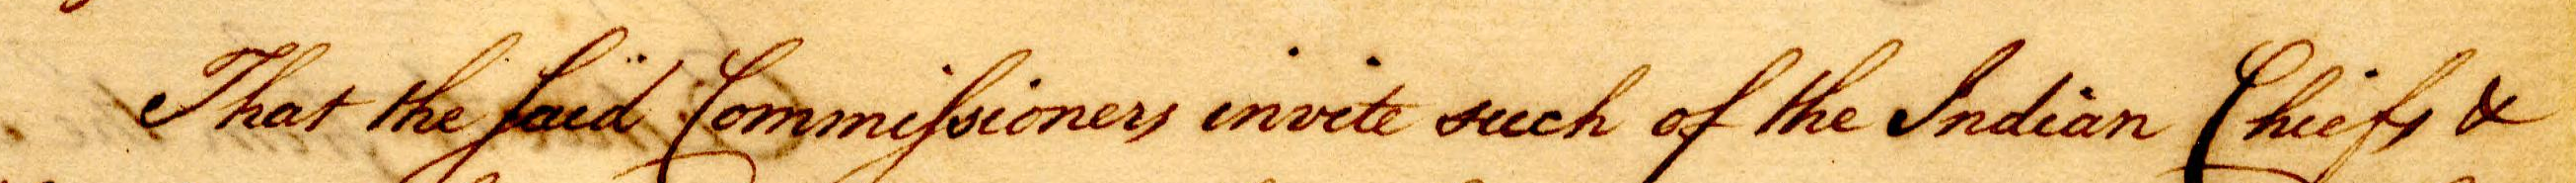That the said Commissioners invite such of the Indian Chiefs &
